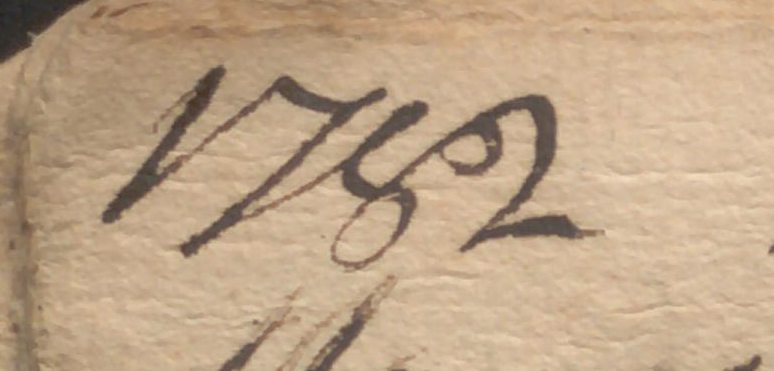1782
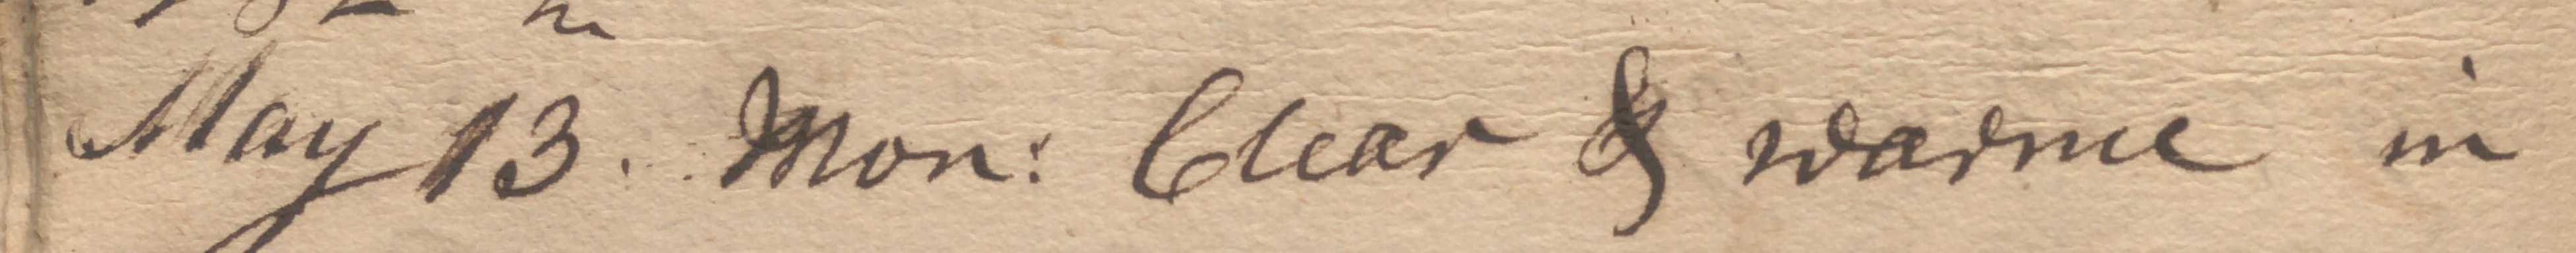May 13^th. Mon. Clear & warme in
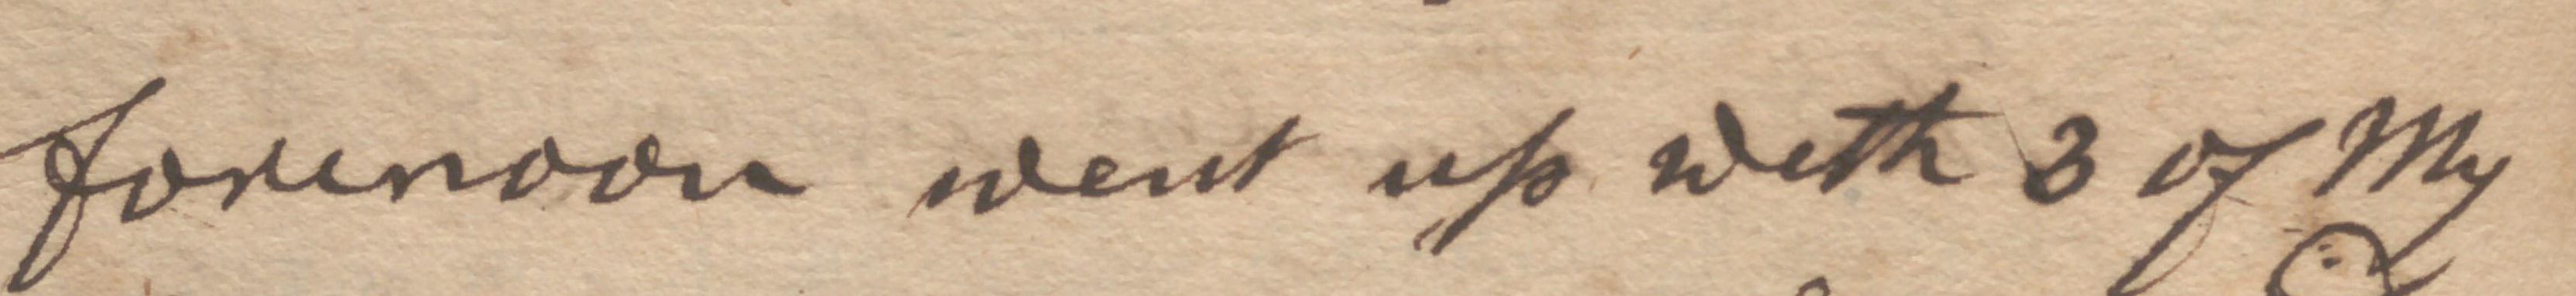forenoon went up with 3 of My
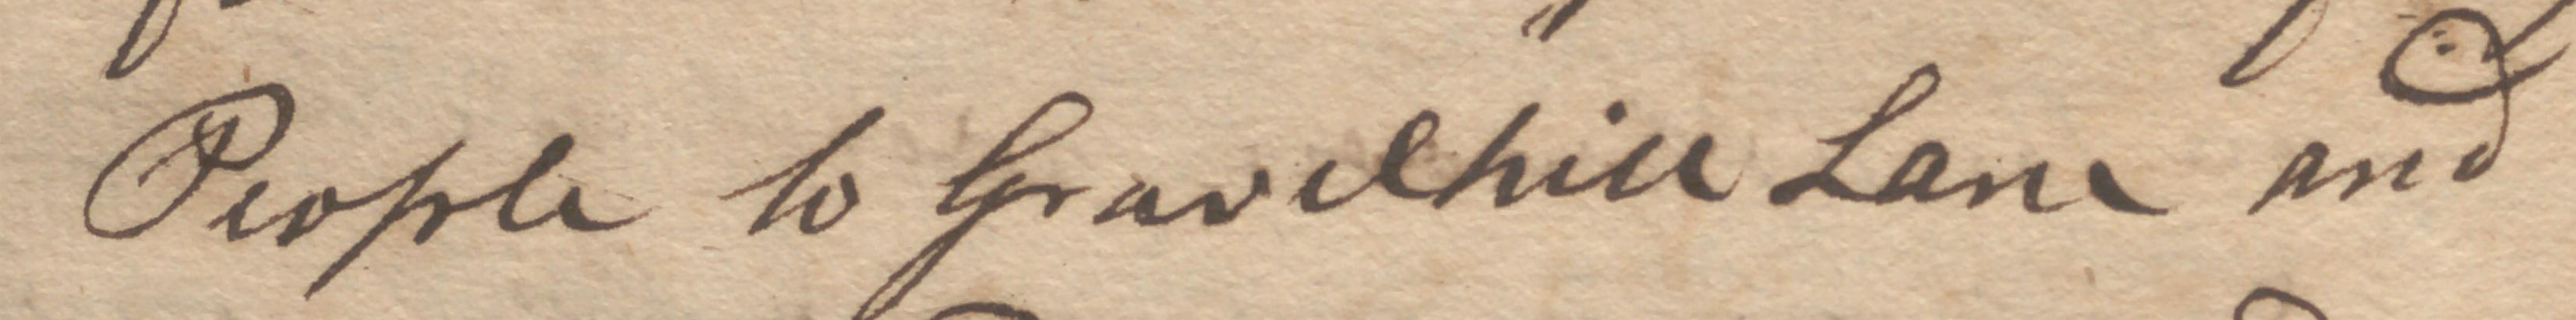People to Gravelhill Lane and
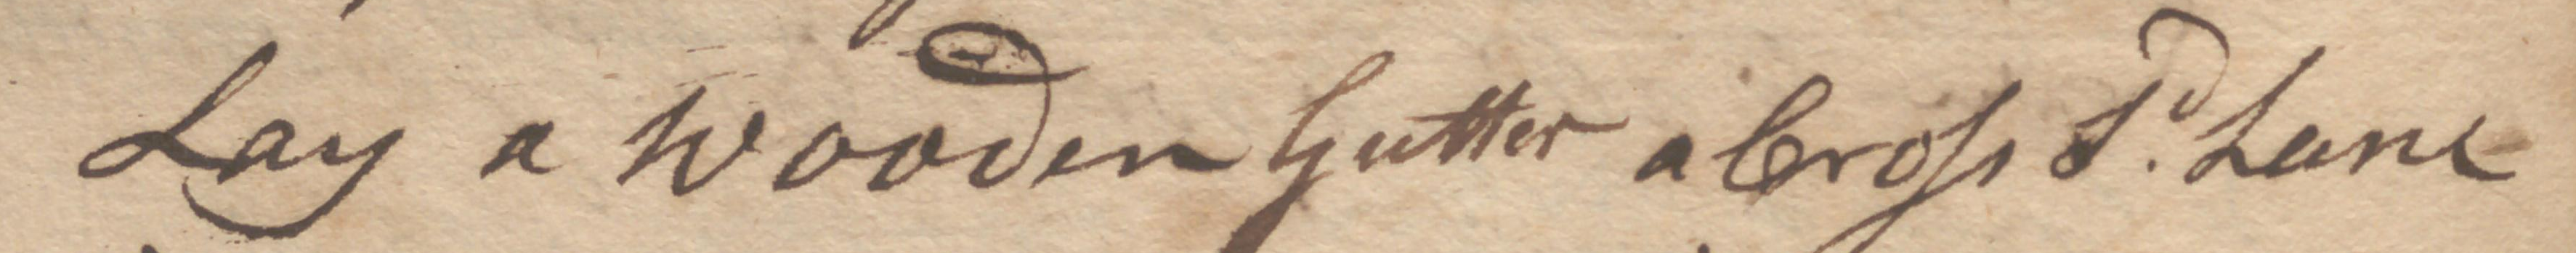Lay a Wooden Gutter a Cross s^d. Lane
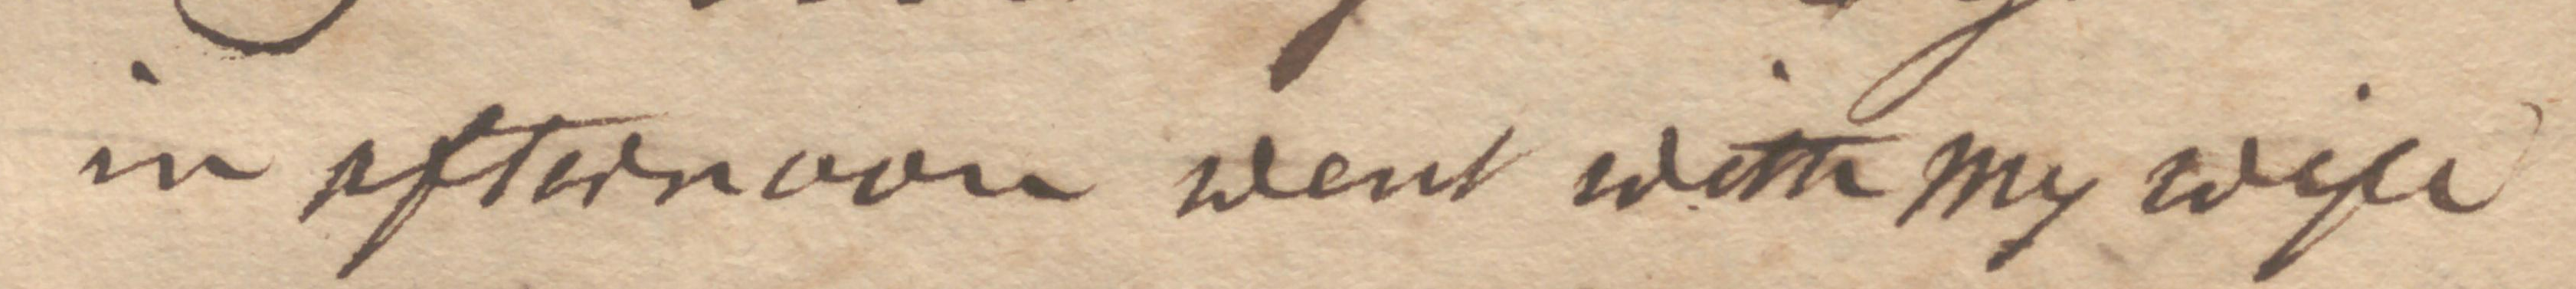in afternoon went with my wife
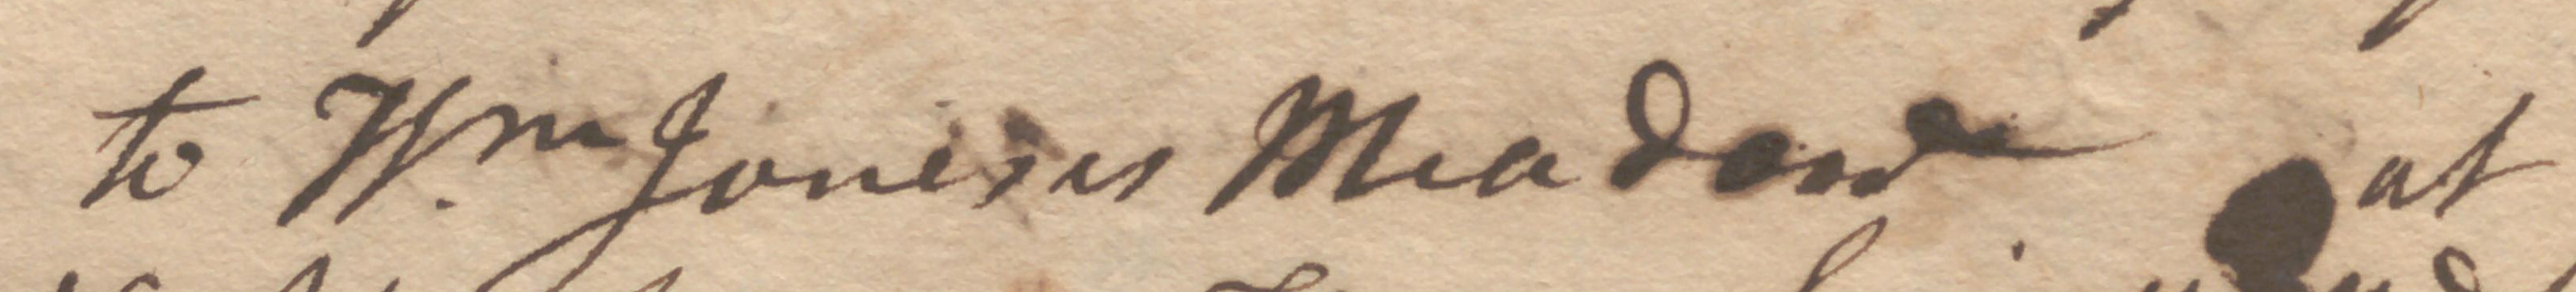to W^m. Joneses Meadow at
